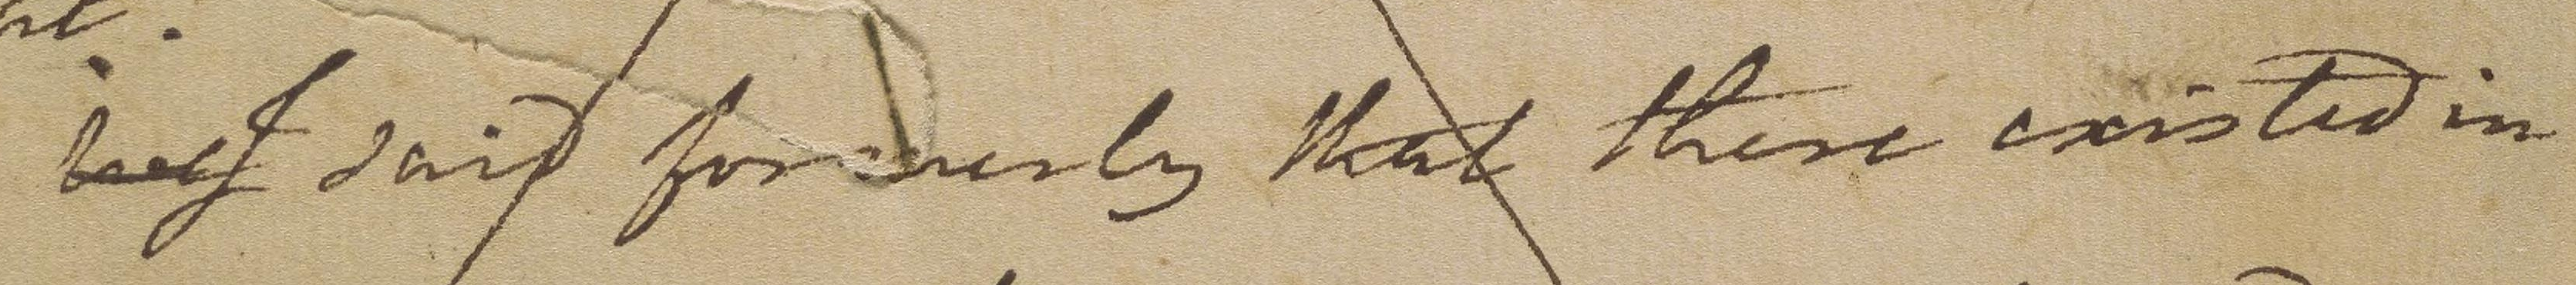I said formerly that there existed in
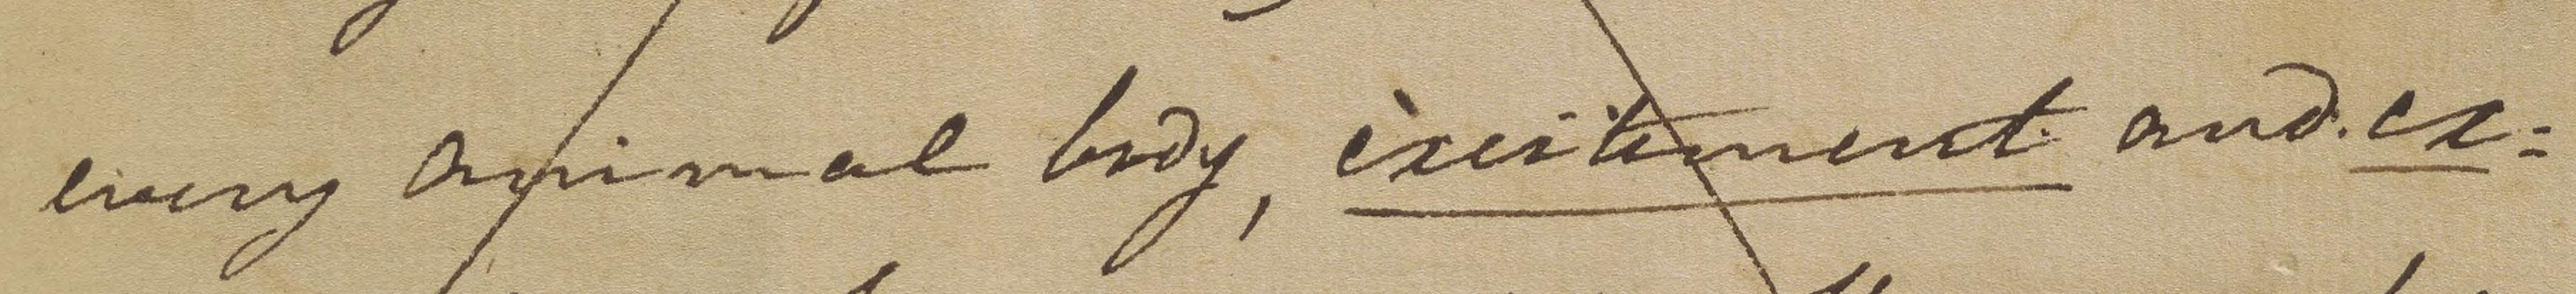every animal body, excitement and ex-
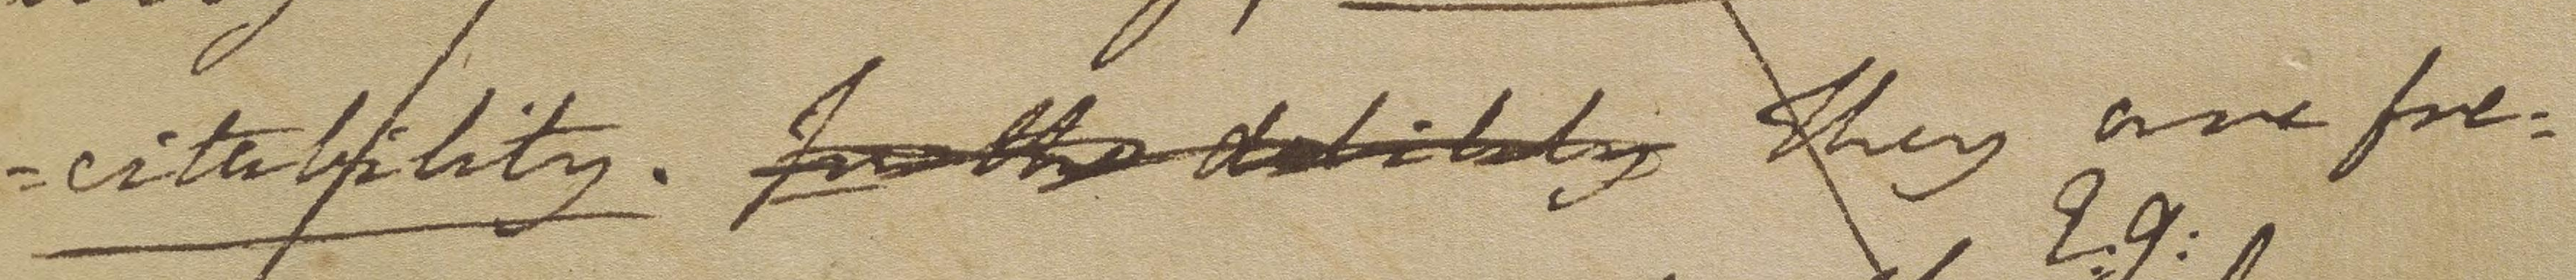-citability. [In the debility] They are fre-
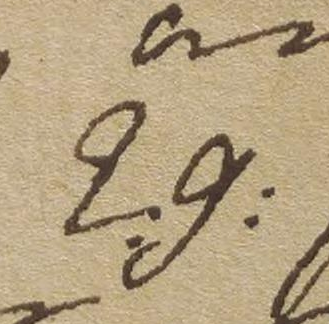Eg:
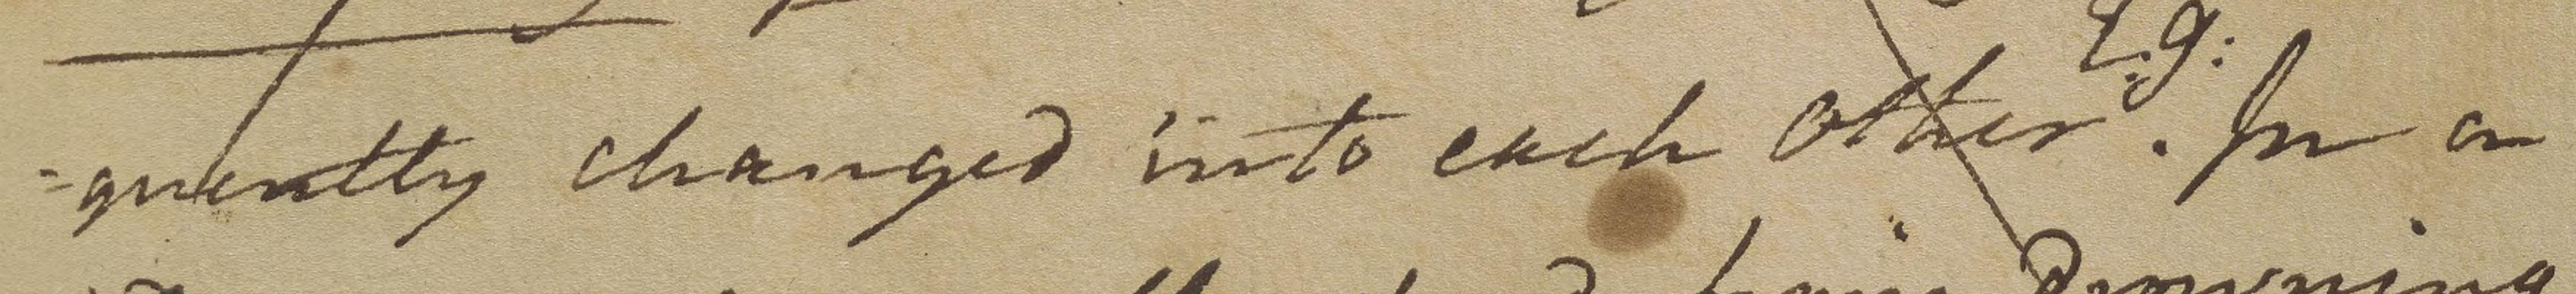-quently changed into each other. In a
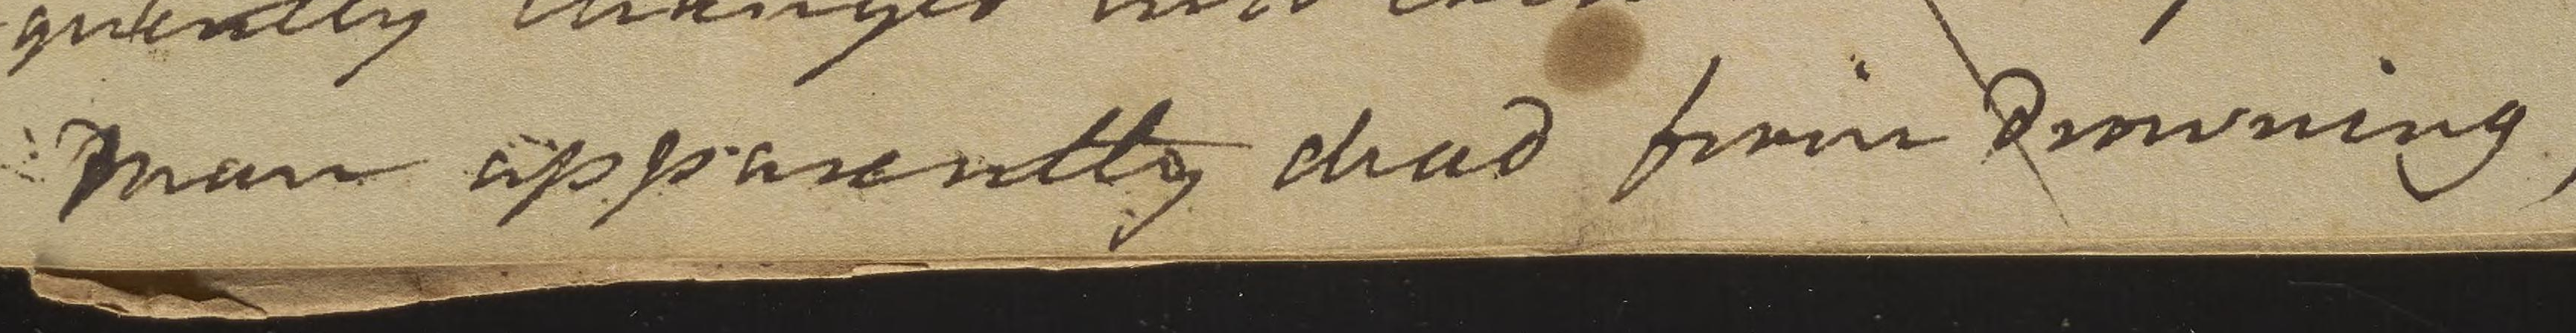man apparently dead from drowning,
